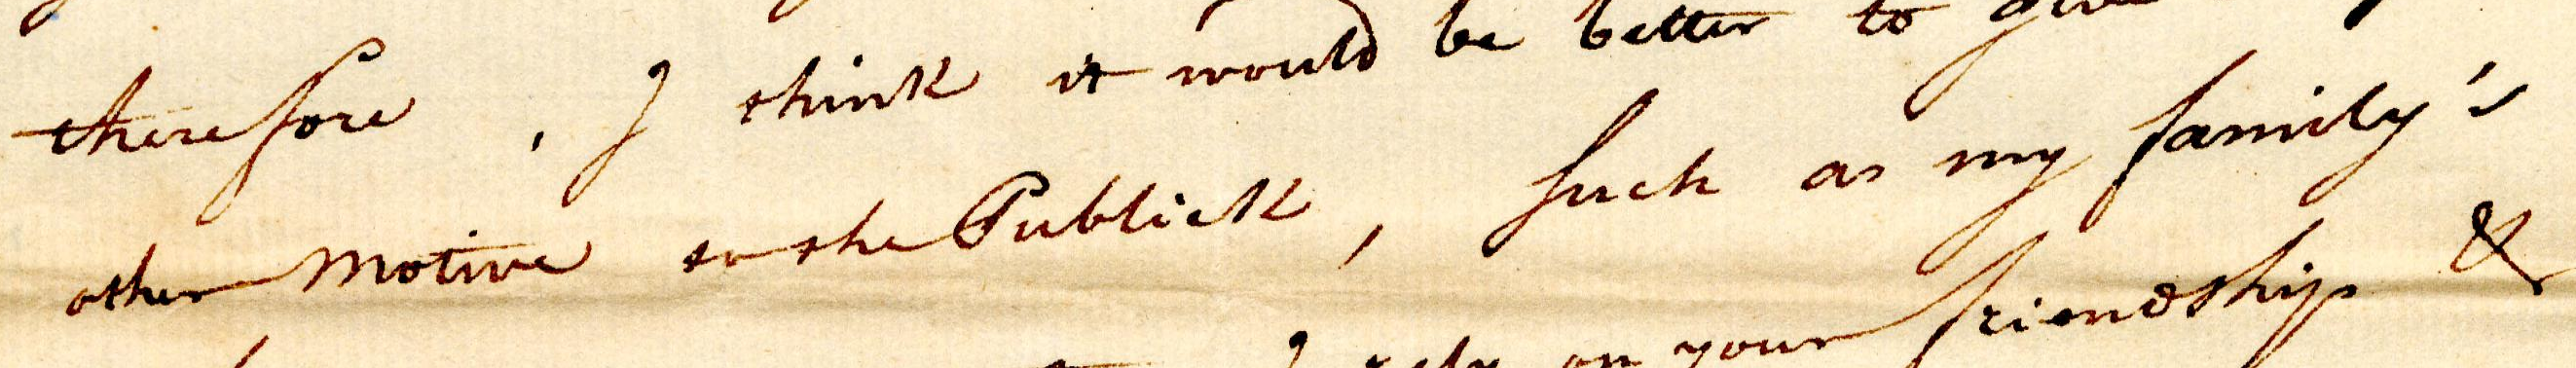other motive to the Publick, such as my family's
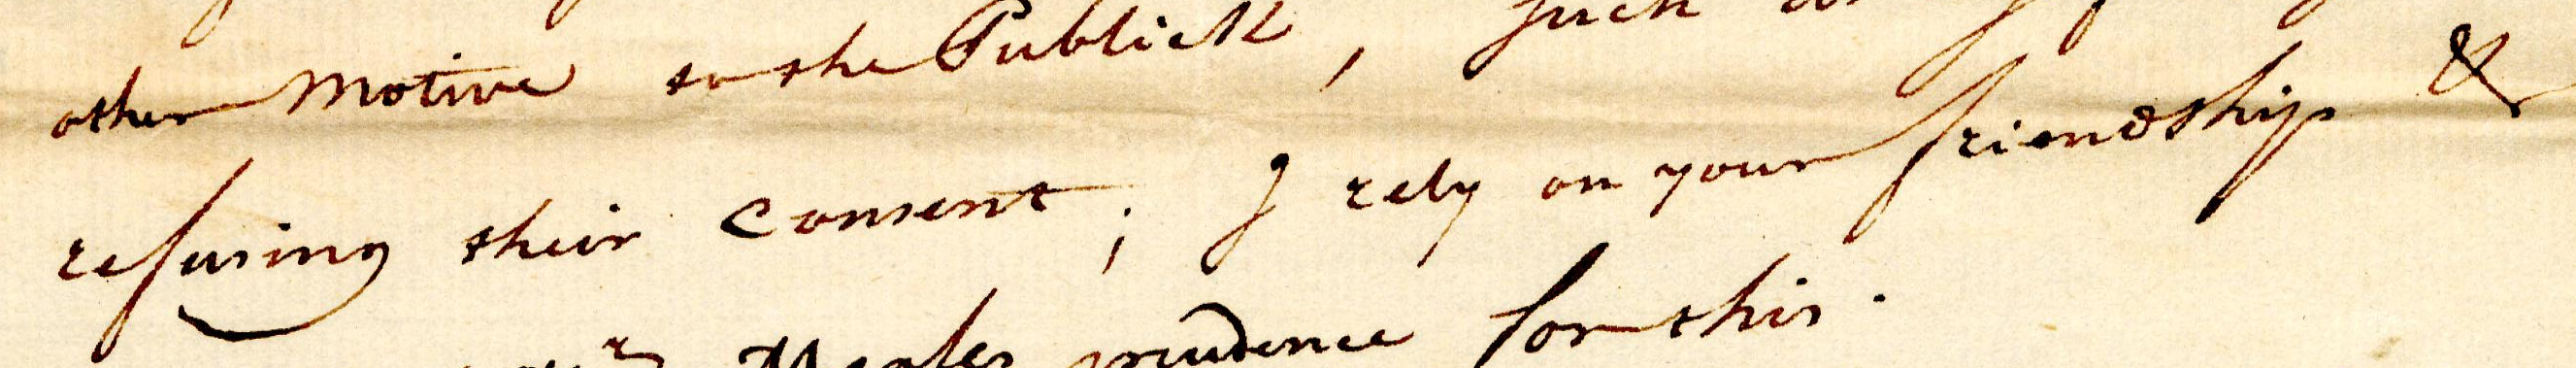refusing their consent; I rely on your friendship &
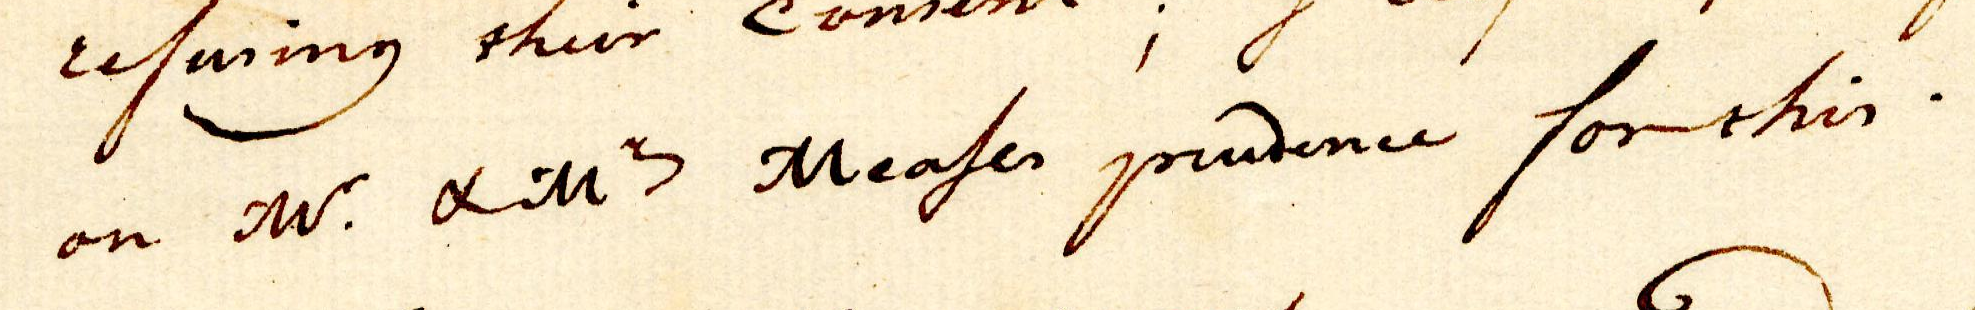on M^r. & M^rs Meases prudence for this.
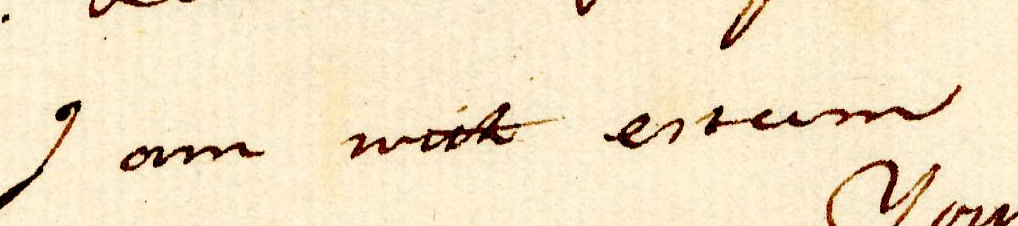I am with esteem
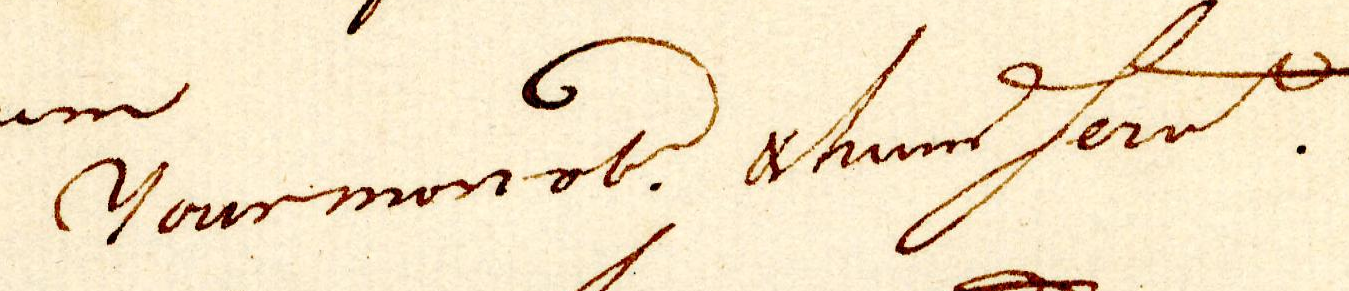Your most ob^d. & hum^e Serv^t.
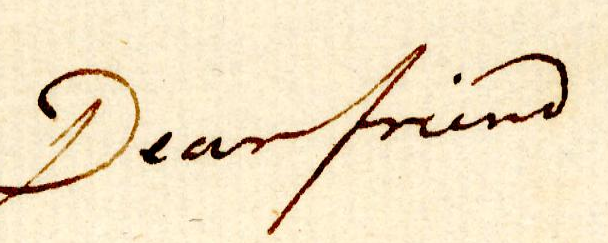Dear friend
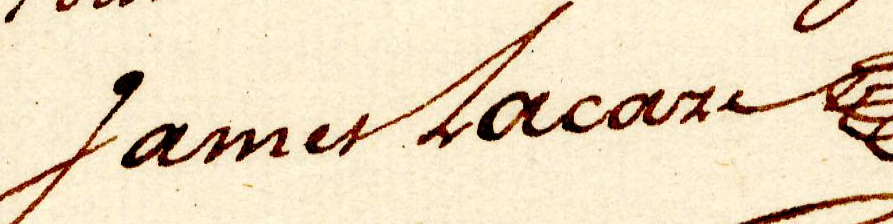James Lacaze
